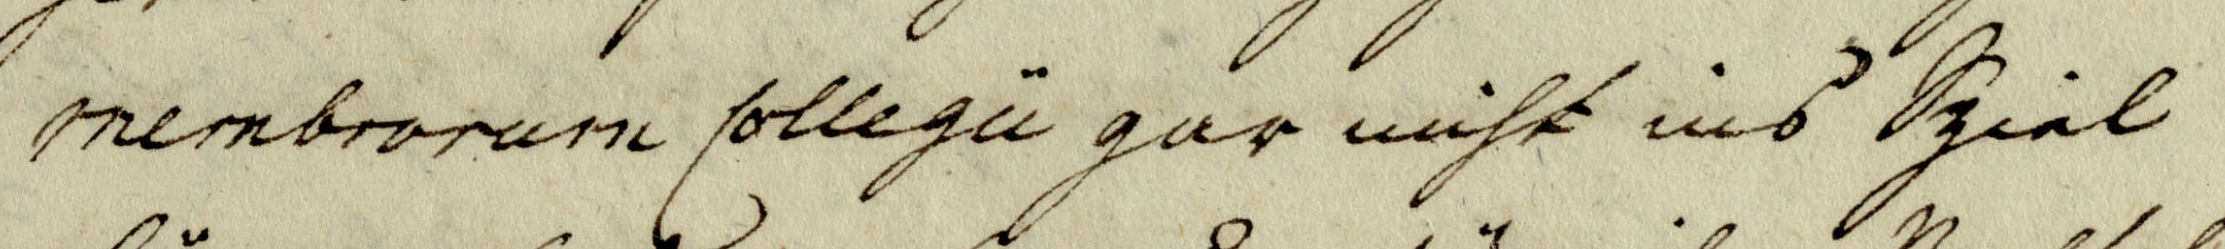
membrorum Collegii gar nicht ins Spiel
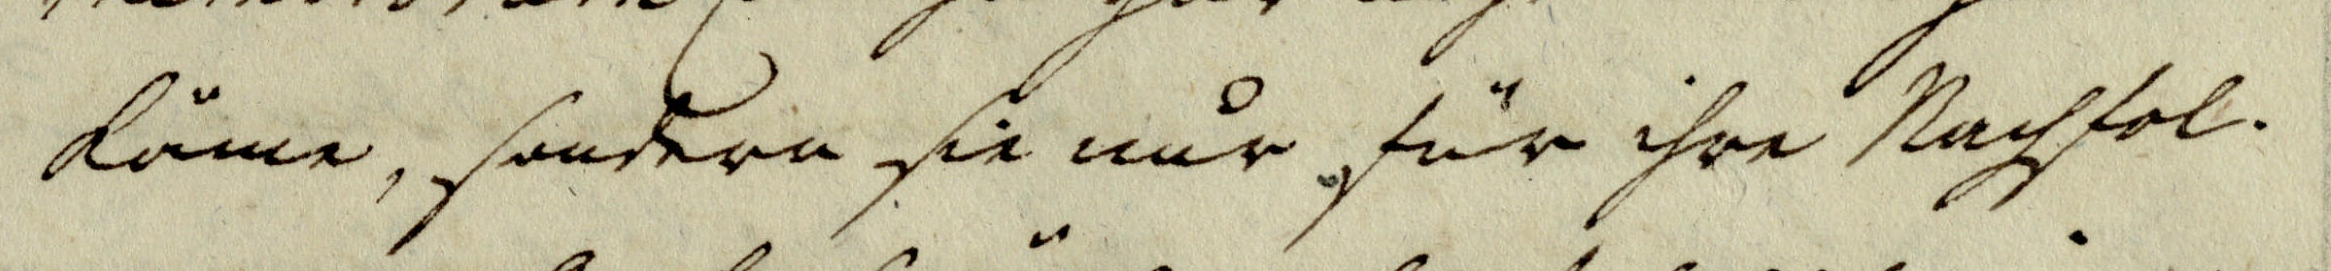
käme, sondern sie nur für ihre Nachfol¬
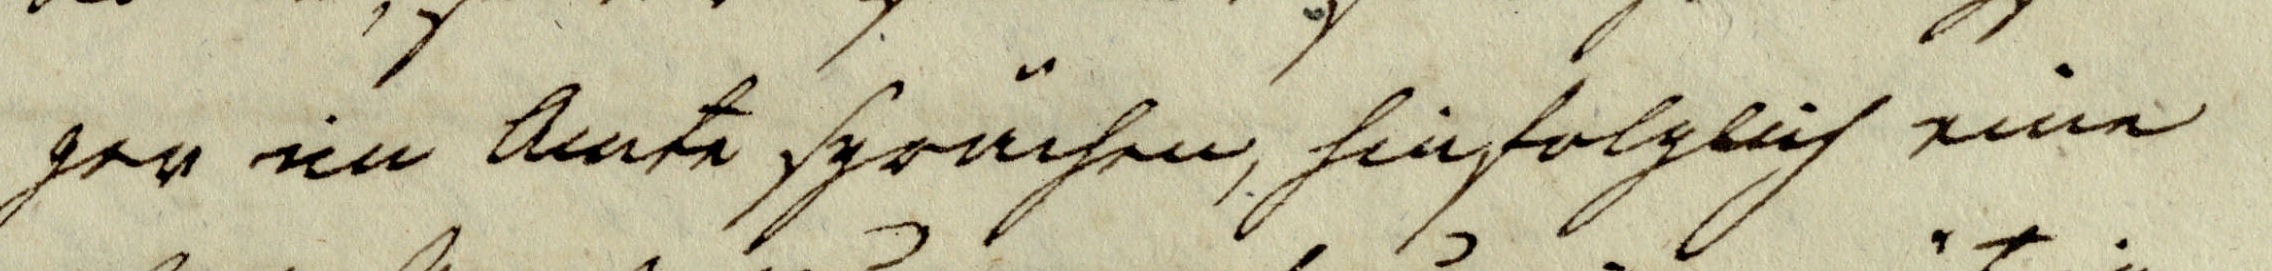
ger im Amte sprächen, hinfolglich eine
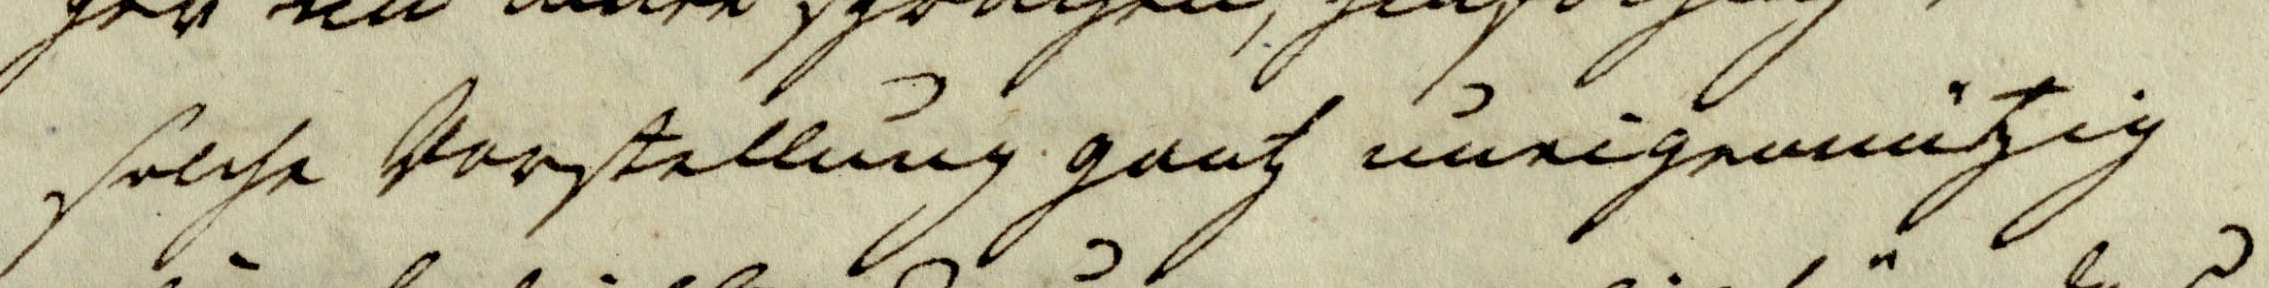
solche Vorstellung gantz uneigennützig
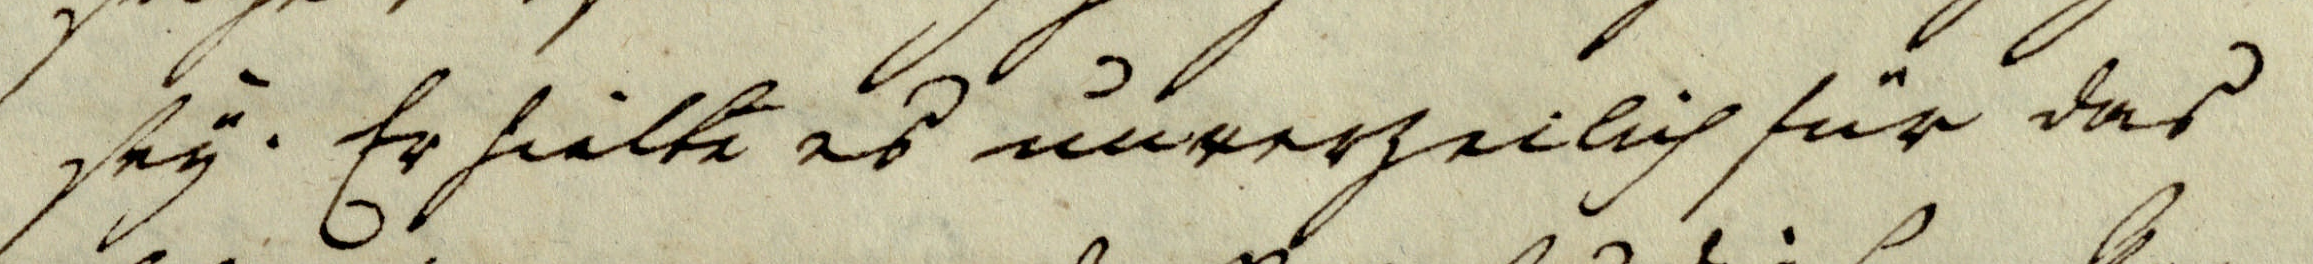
seÿ. Er hielte es unverzeilich für das
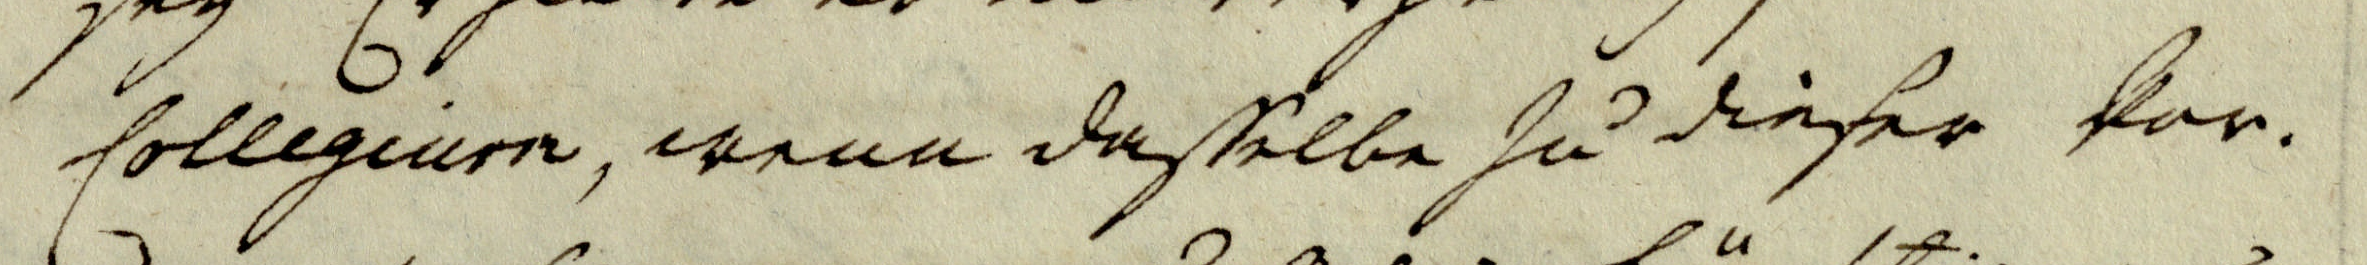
Collegium, wenn dasselbe zu dieser Vor¬
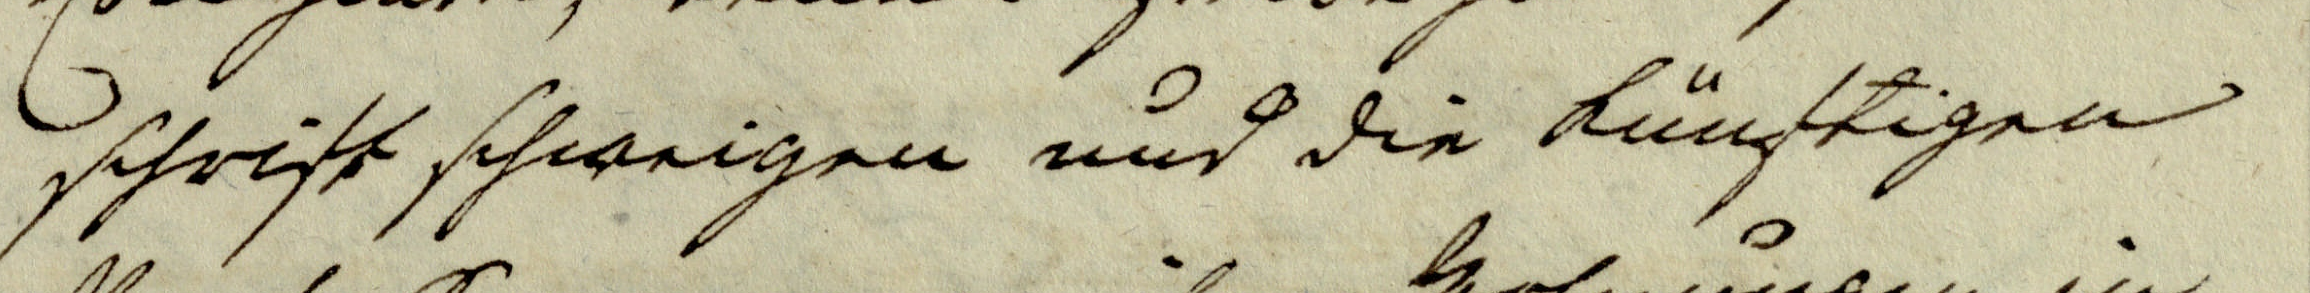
schrift schweigen und die künftigen
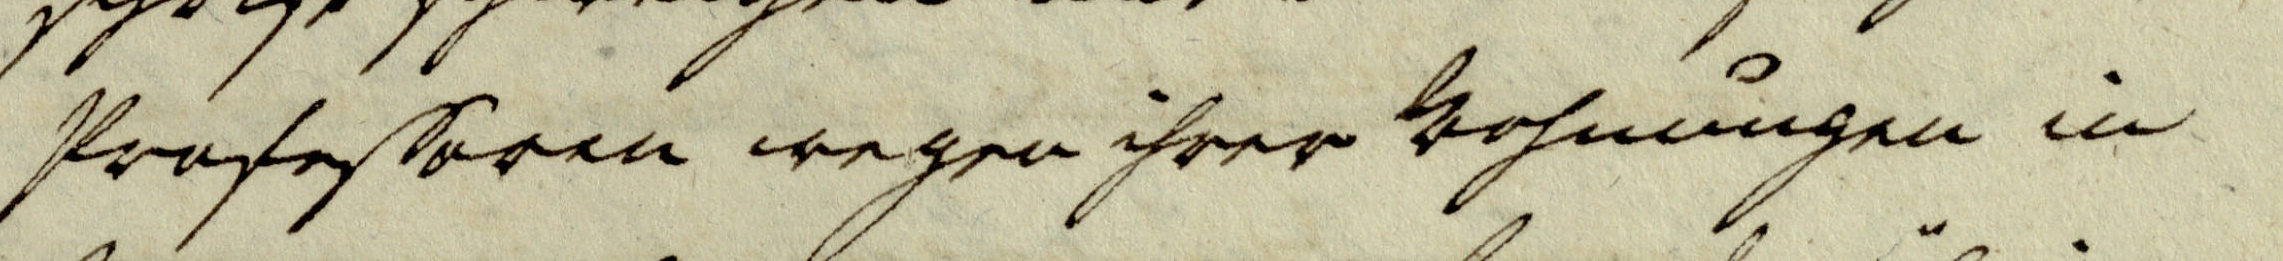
Professoren wegen ihrer Wohnungen in
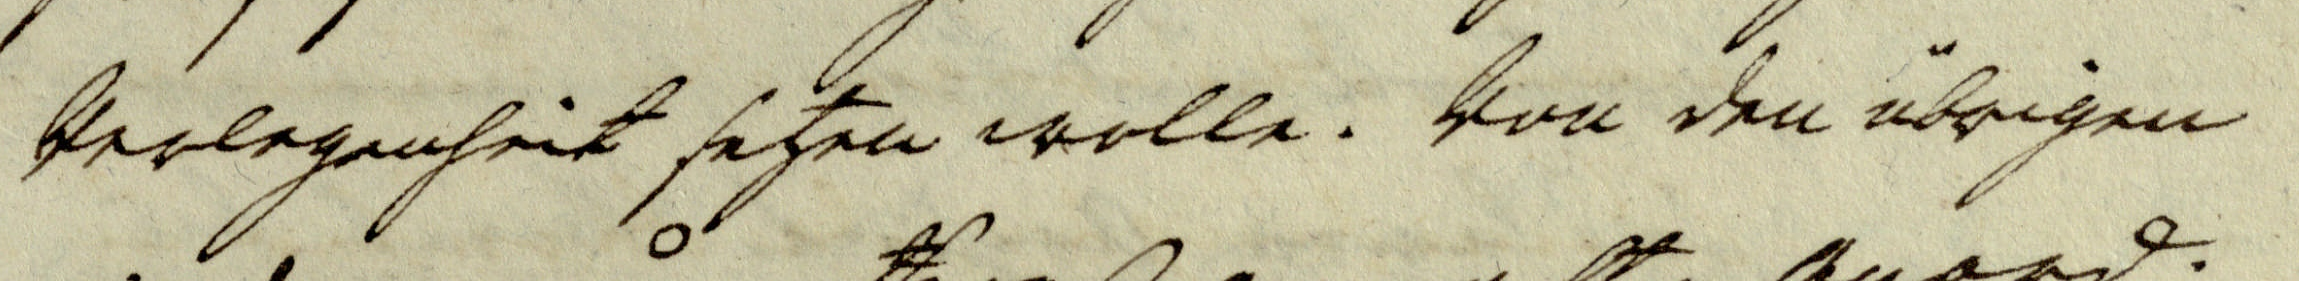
Verlegenheit setzen wolle. Von den übrigen
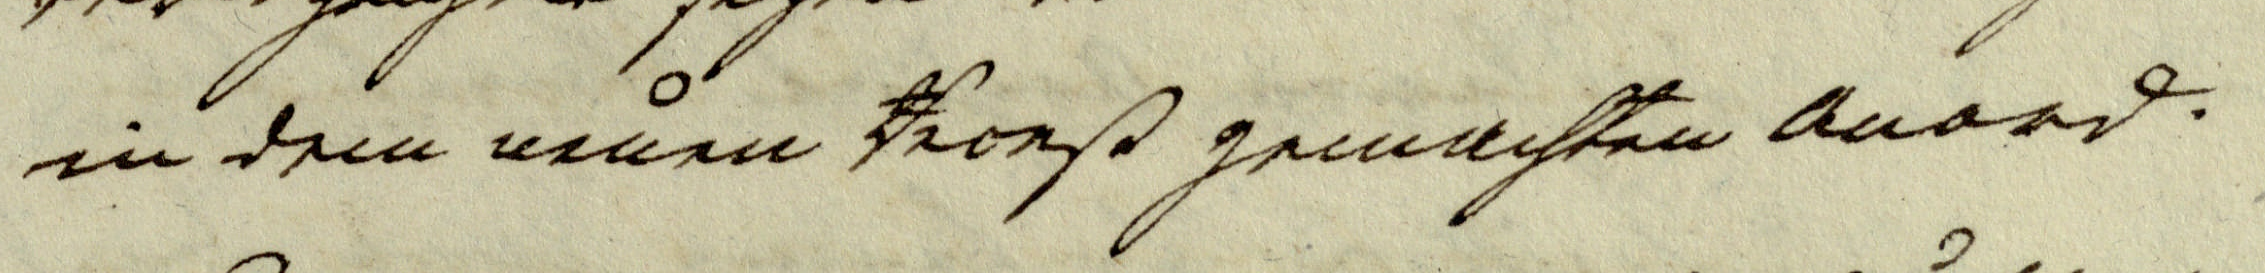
in dem neuen Receß gemachten Anord¬
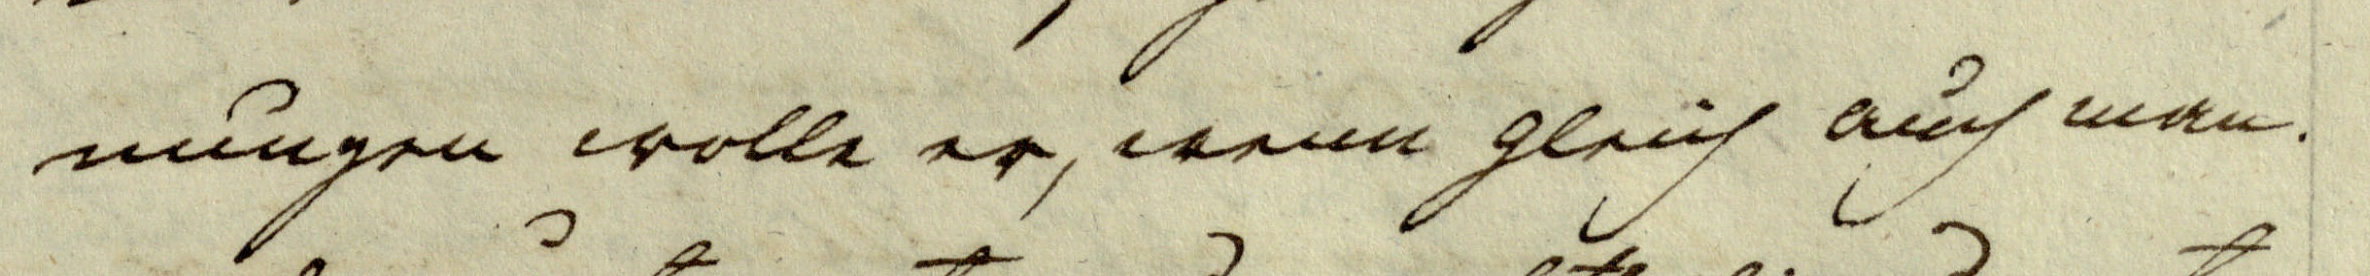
nungen wolle er, wenn gleich auch man¬
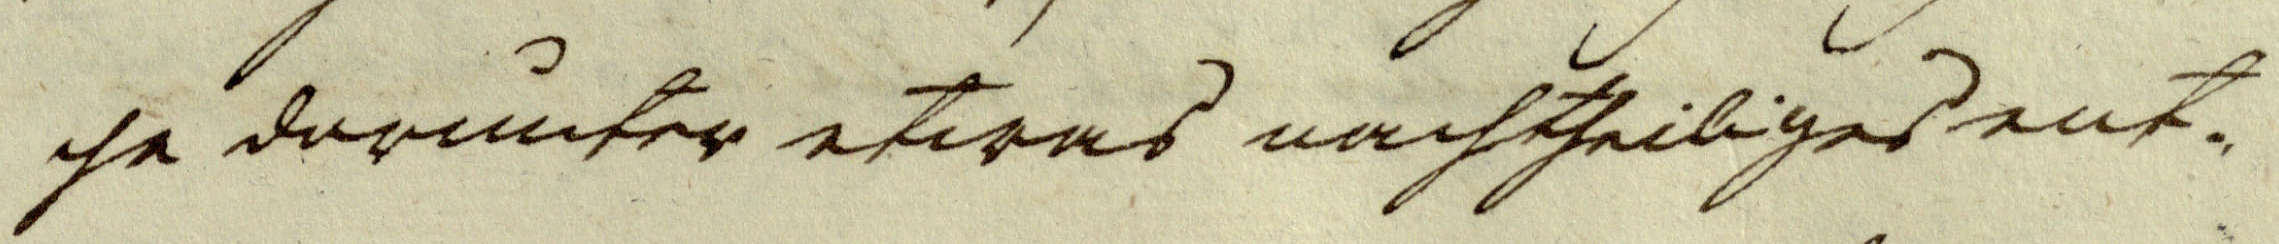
che darunter etwas nachtheiliges ent¬
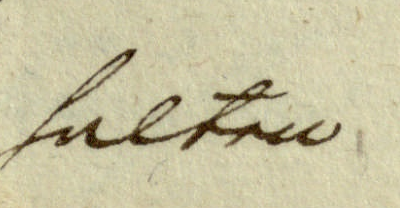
halten
